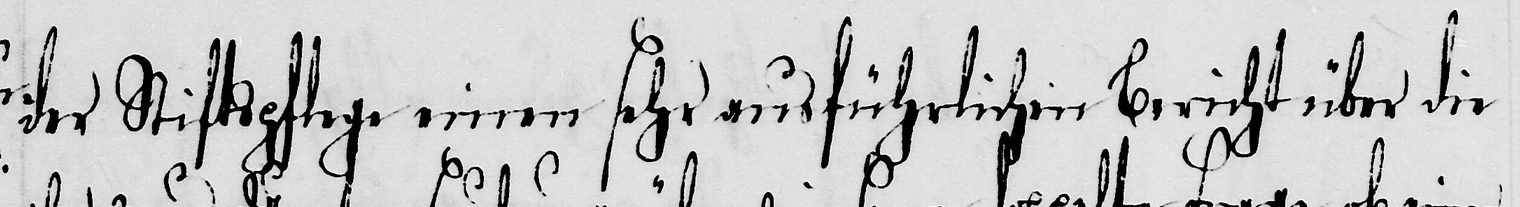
der Stiftspflege einen sehr ausführlichen Bericht über die
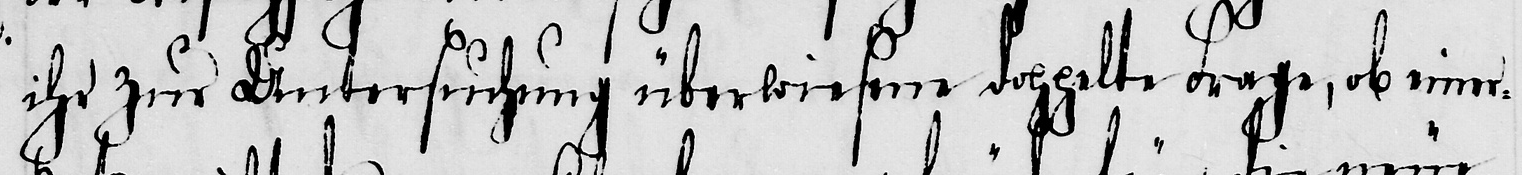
ihr zur Untersuchung überwiesen doppelte Frage, ob eine¬
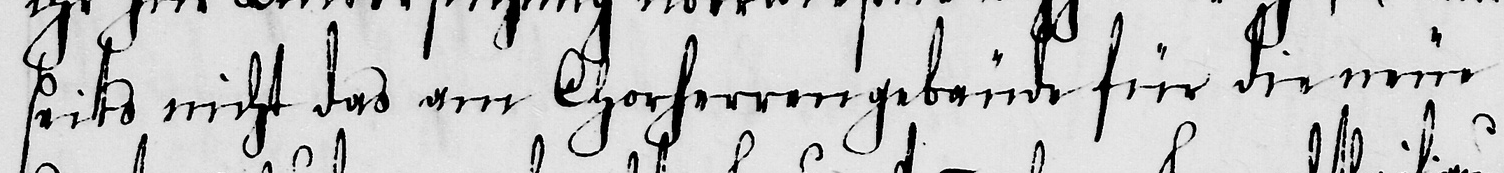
rseits nicht das am Chorherrengebäude für die neue
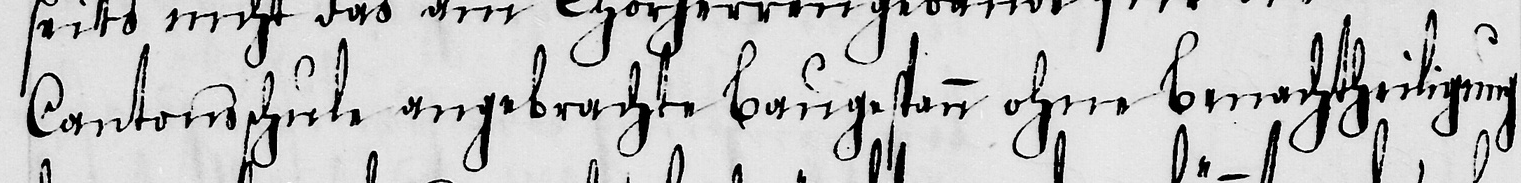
Cantonsschule angebrachte Baugespann ohne Benachtheiligung
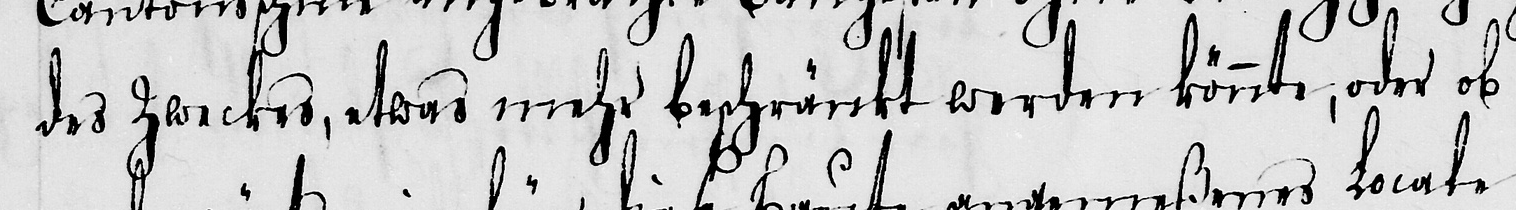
des Zweckes, etwas mehr beschränkt werden könnte, oder ob
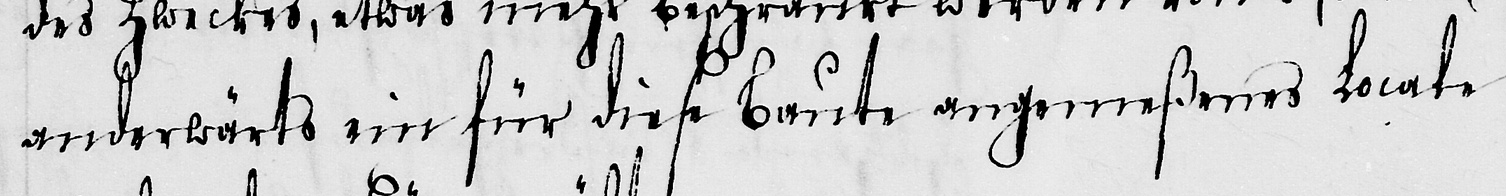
anderwärts ein für diese Baute angemeßenes Locale
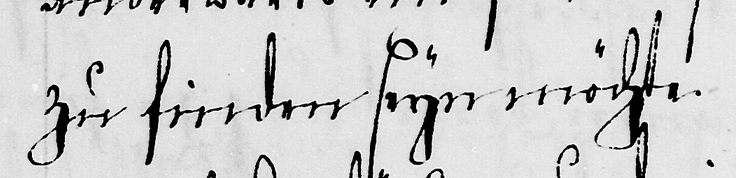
zu finden seyn möchte.
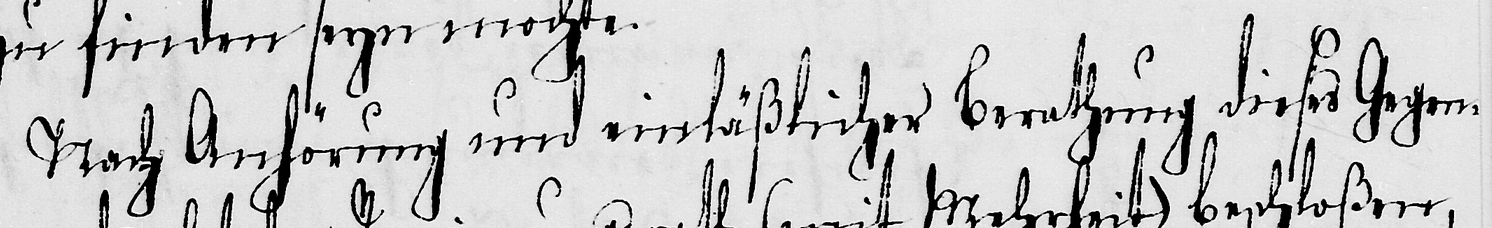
Nach Anhörung und einläßlicher Berathung dieses Gegen¬
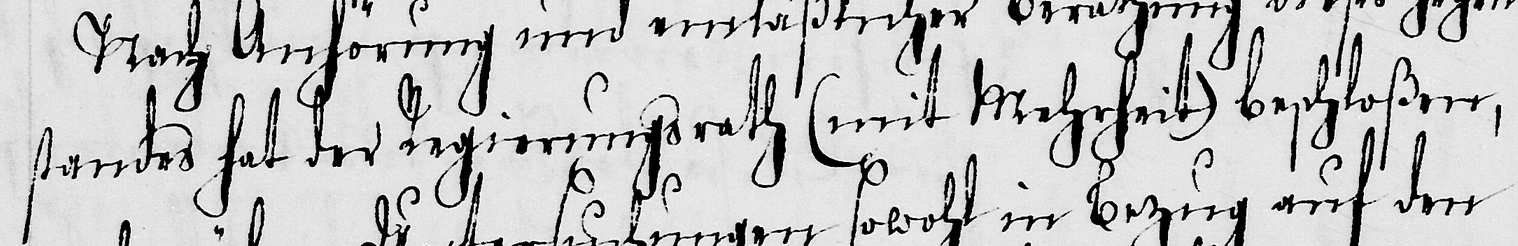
standes hat der Regierungsrath (mit Mehrheit) beschloßen,
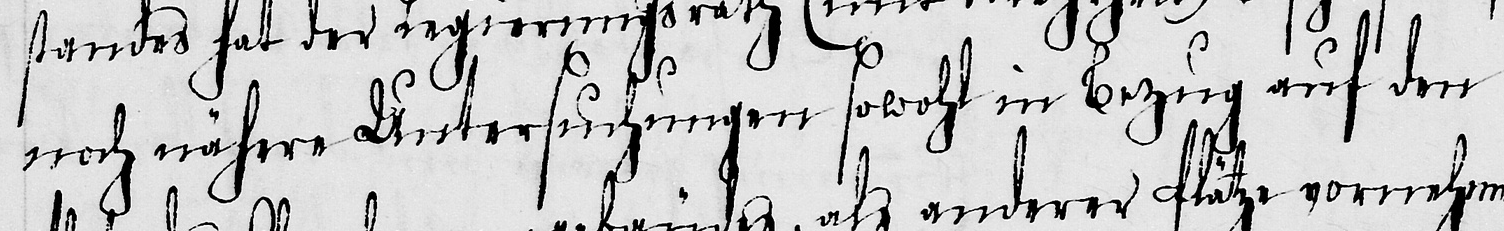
noch nähere Untersuchungen sowohl in Bezug auf den
